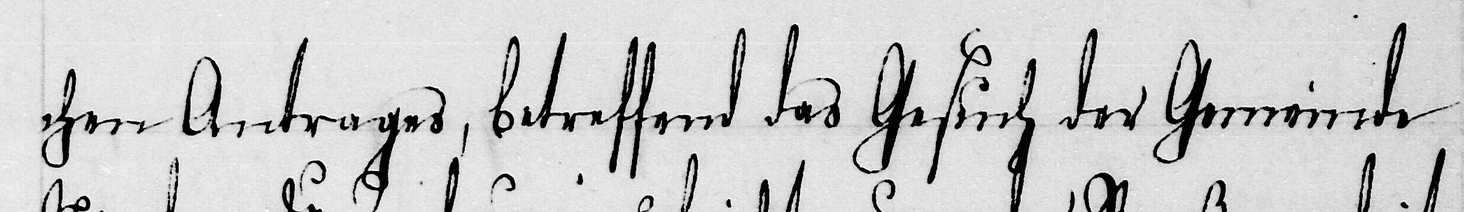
chen Antrages, betreffend das Gesuch der Gemeinde
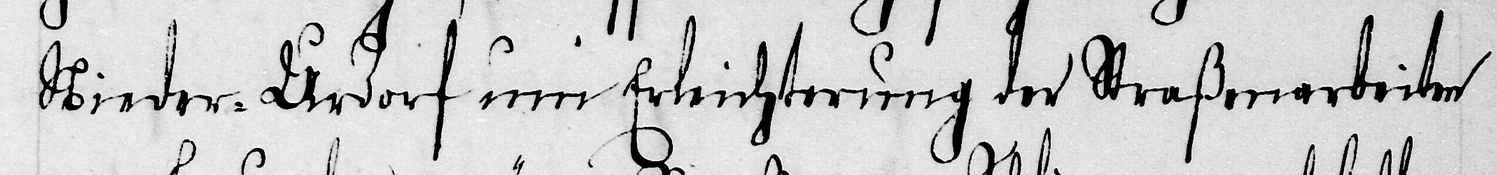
Nieder-Urdorf um Erleichterung der Straßenarbeiten
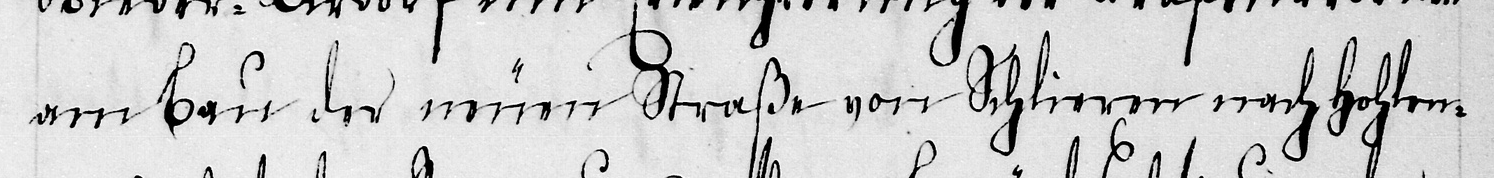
am Bau der neuen Straße von Schlieren nach Hohlens¬
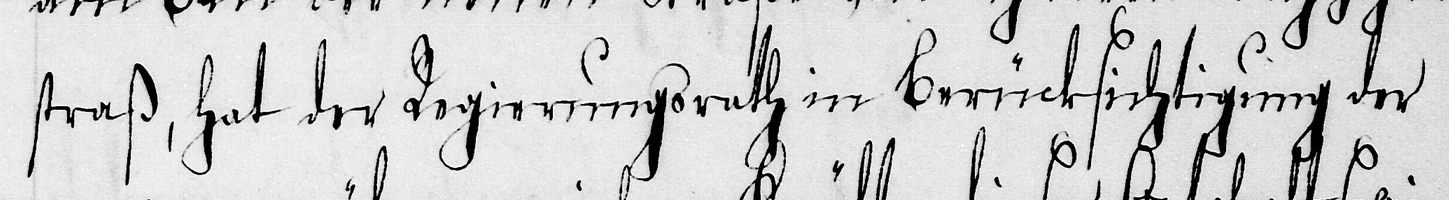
traß, hat der Regierungsrath in Berücksichtigung der
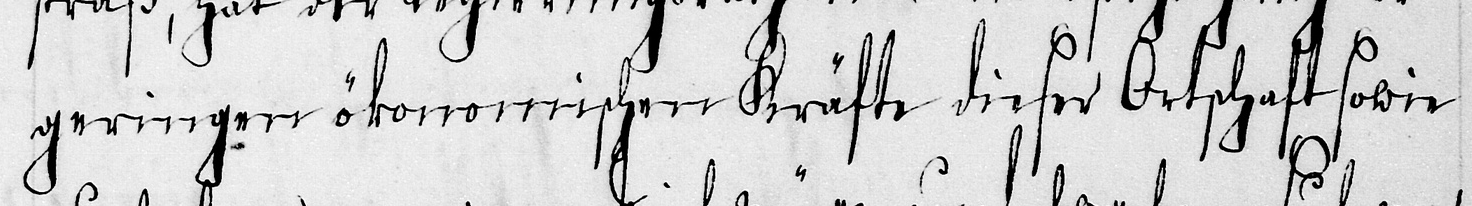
geringen ökonomischen Kräfte dieser Ortschaft sowie
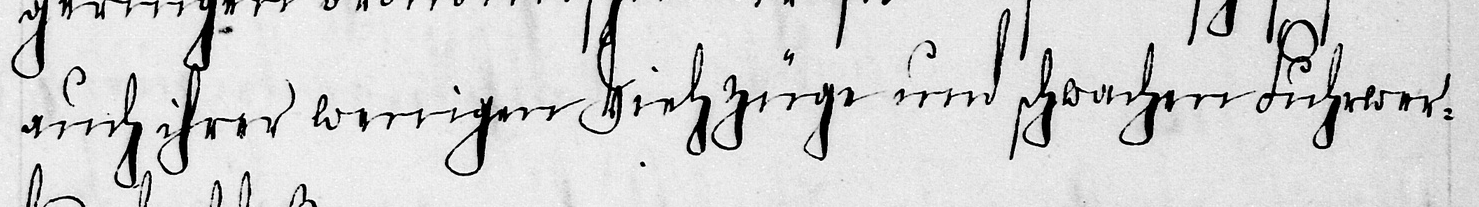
auch ihrer wenigen Viehzüge und schwachen Fuhrwer¬
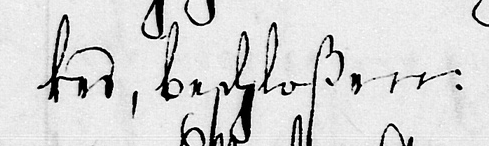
ke, beschloßen:
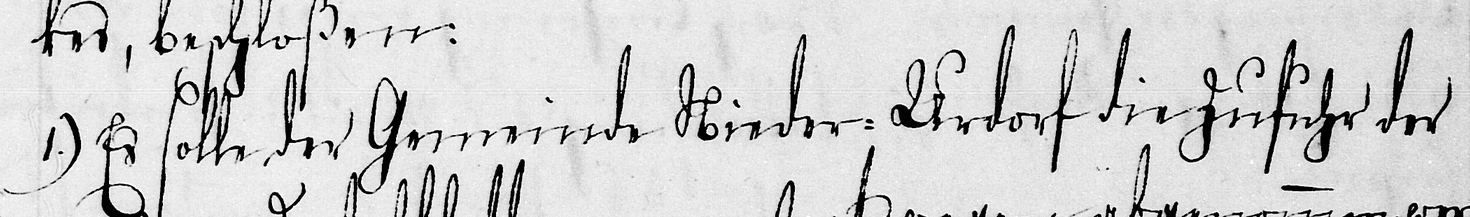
Es solle der Gemeinde Nieder-Urdorf die Zufuhr der
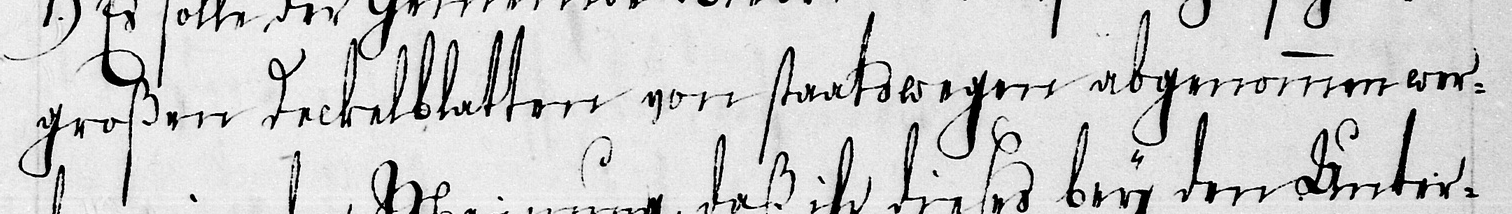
großen Deckelblatten von staatswegen abgenommen wer¬
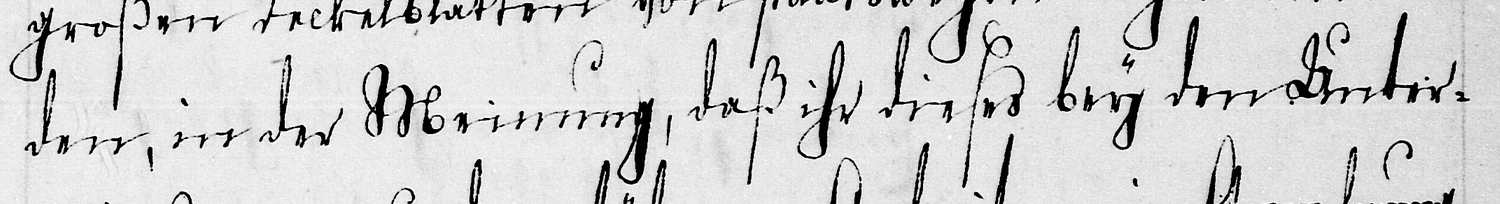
den, in der Meinung, das ihr dieses bey den Unter¬
